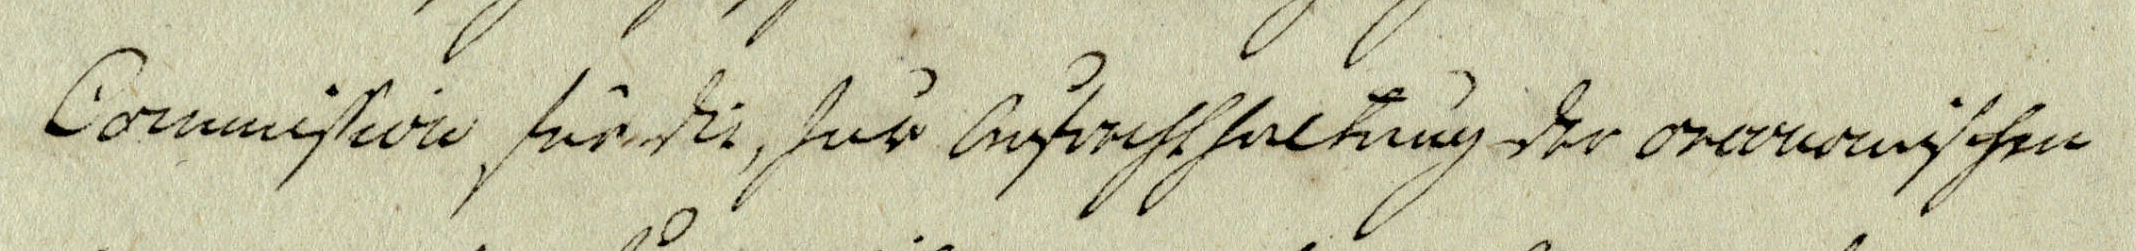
Commission für die, zur Aufrechthaltung der oeconomischen
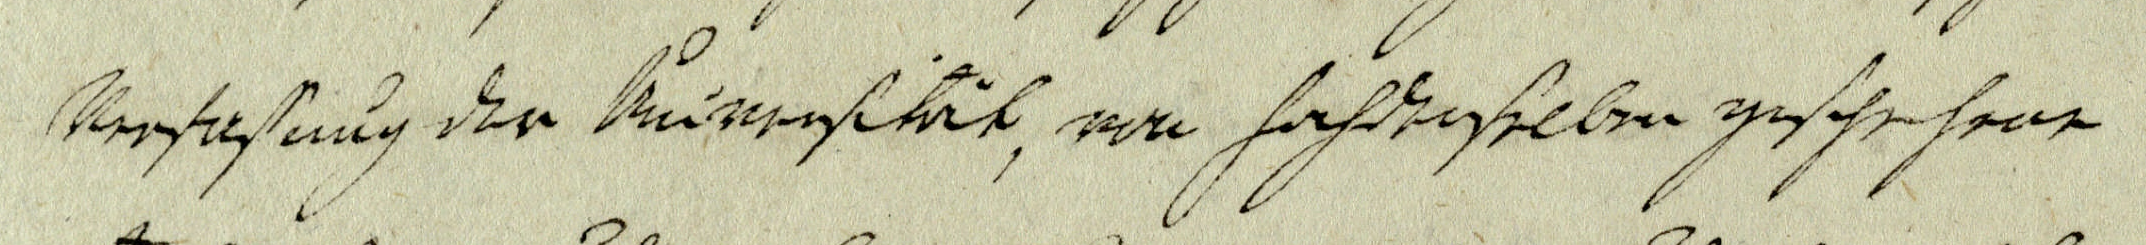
Verfassung der Universität, von Hochderselben geschehene
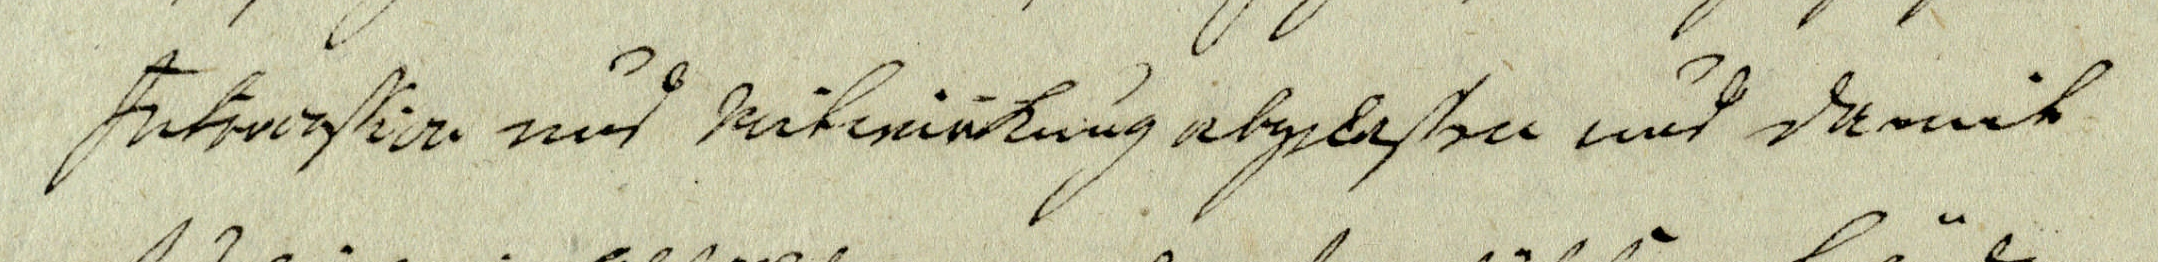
Intercession und Mitwirkung abgelassen und damit
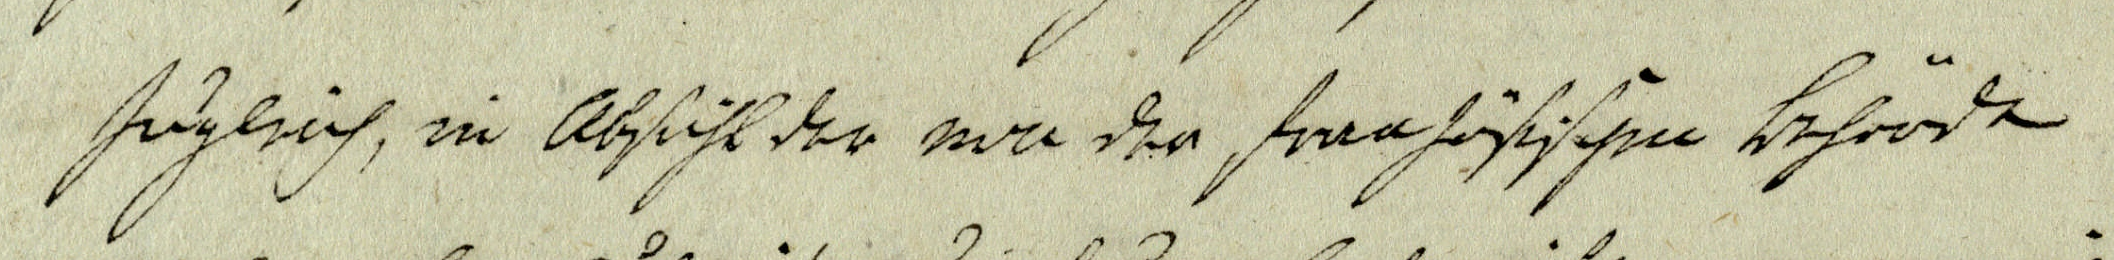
zugleich, in Absicht der von der Französischen Behörde
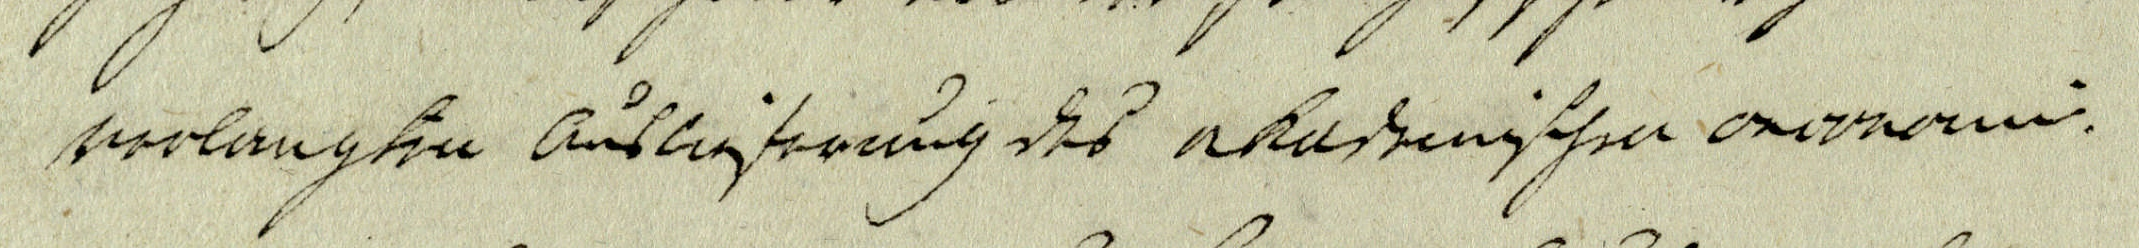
verlangten Auslieferung des akademischen oeconomi¬
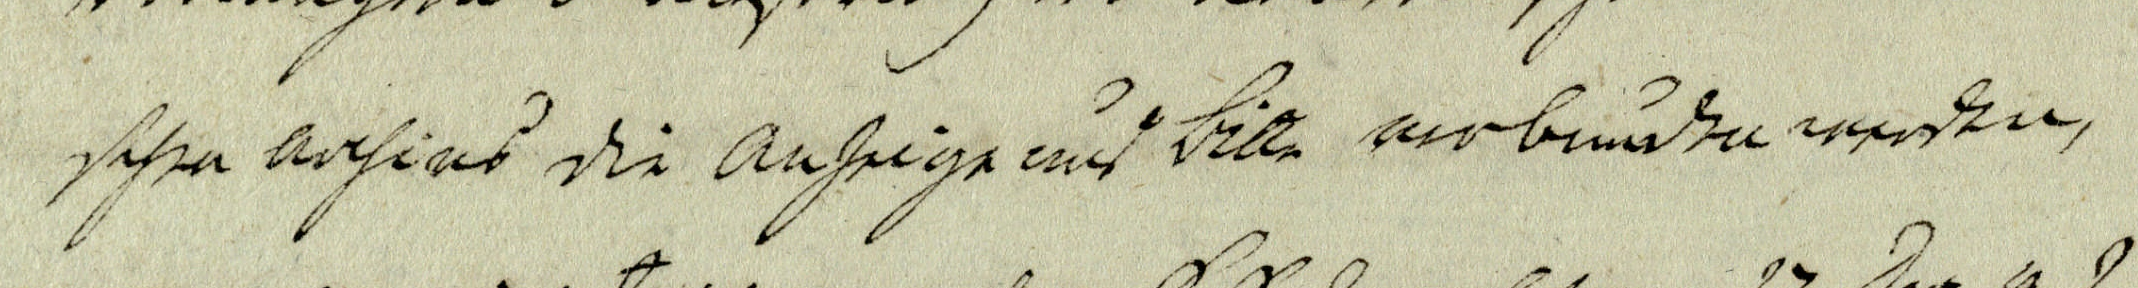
schen Archivs die Anzeige und Bitte verbunden werden,
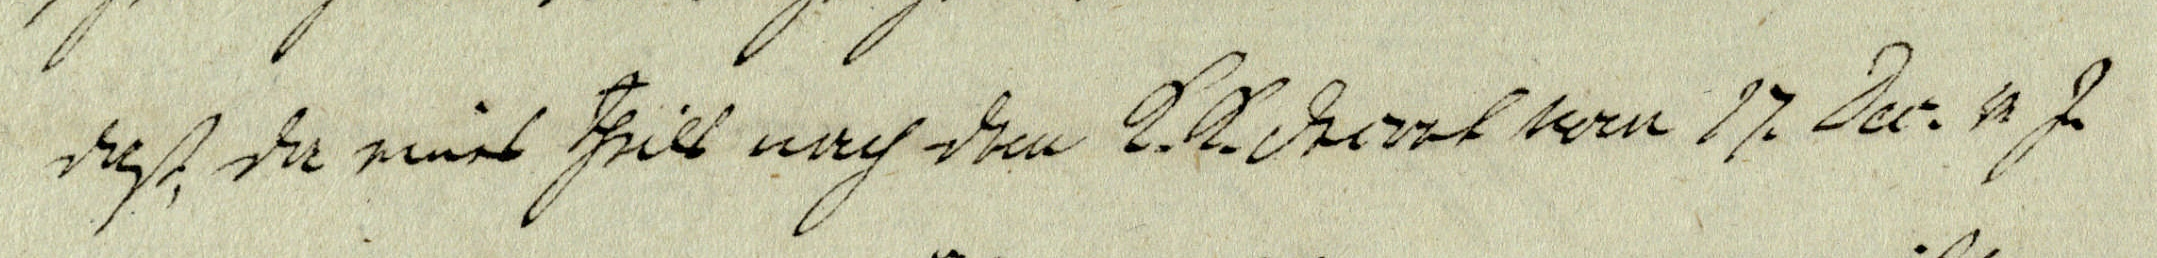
daß, da eines Theils nach dem K. K. Decret vom 17. Dec. v.J.
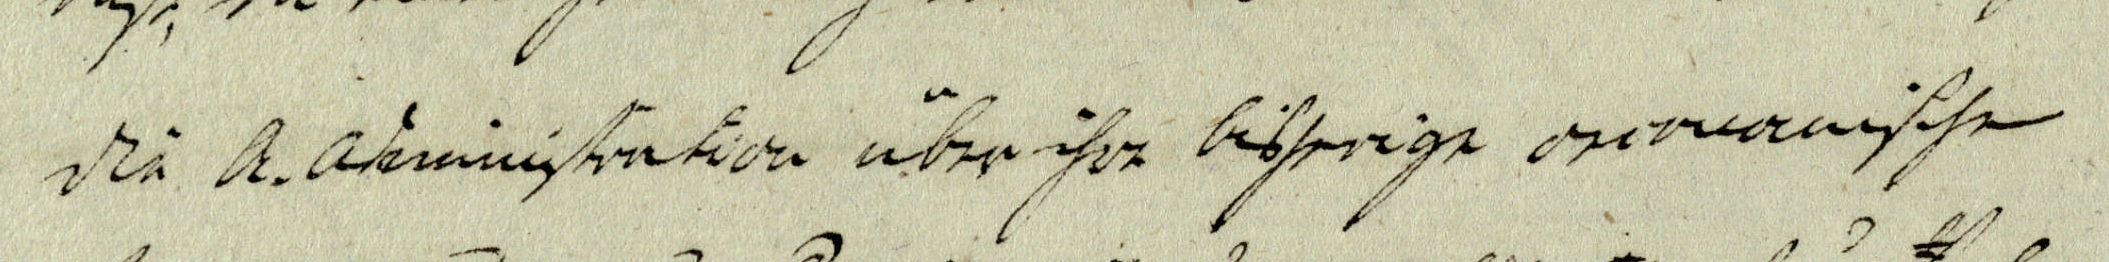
die A. Administration über ihre bisherige oeconomische
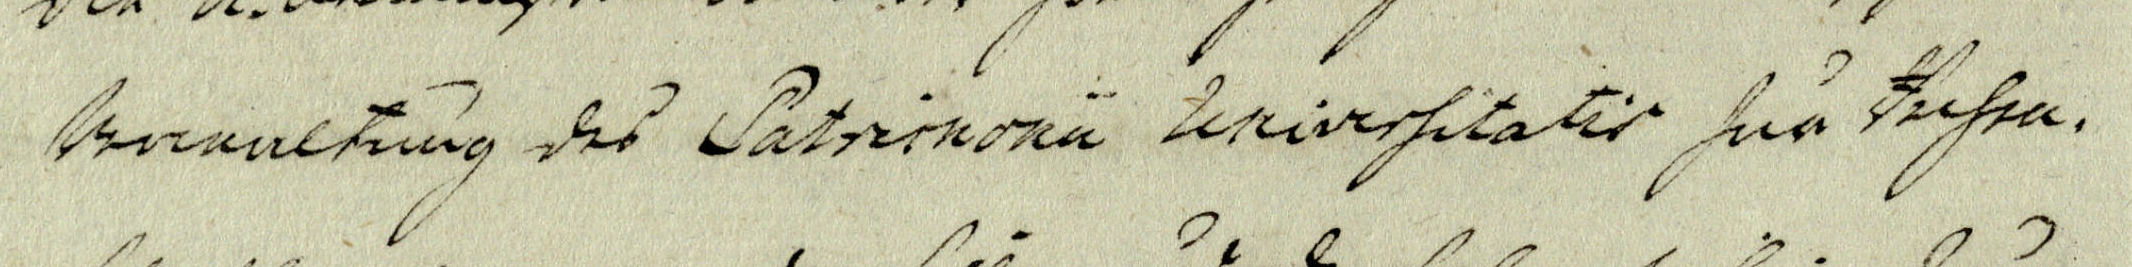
Verwaltung des Patrimonii Universitatis zur Rechen¬
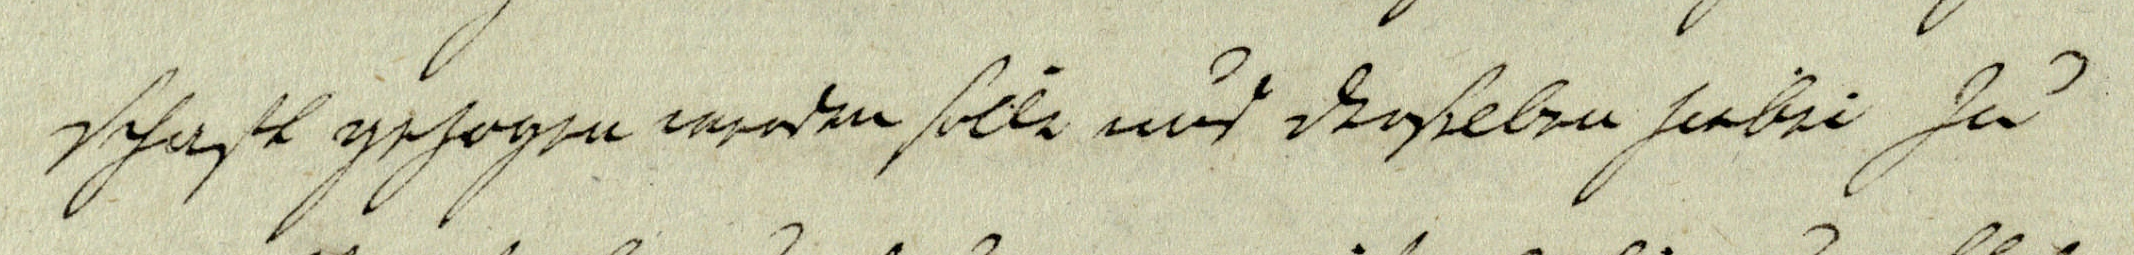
schaft gezogen werden solle und derselben hiebei zu
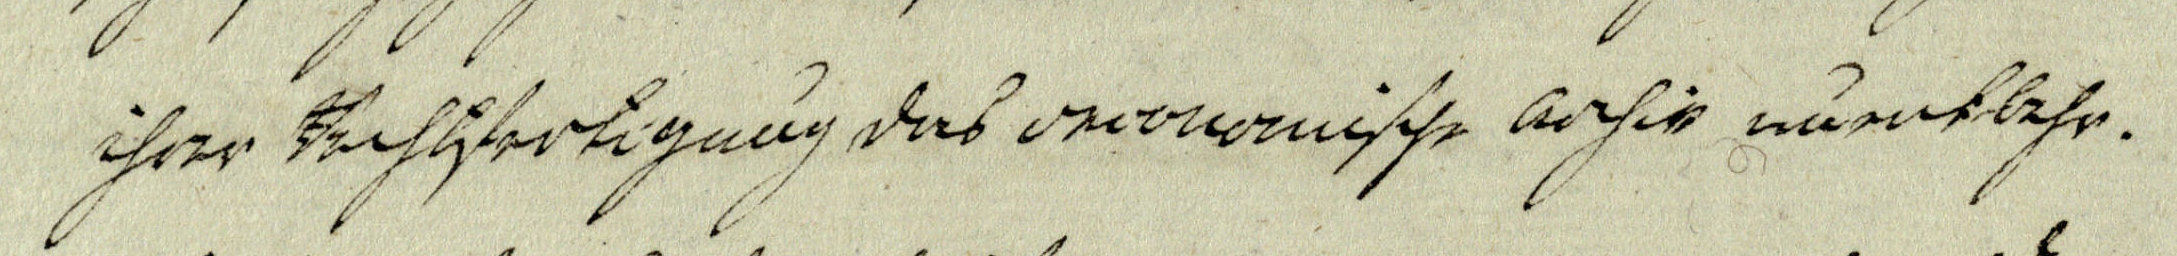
ihrer Rechtfertigung das oeconomische Archiv unentbehr¬
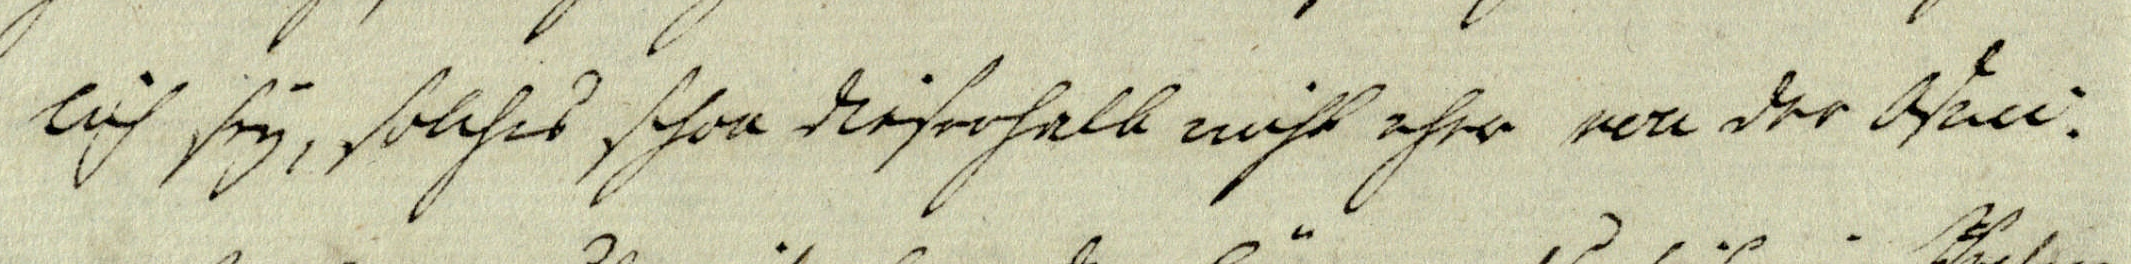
lich seÿ, solches schon dieserhalb nicht eher von der Admi¬
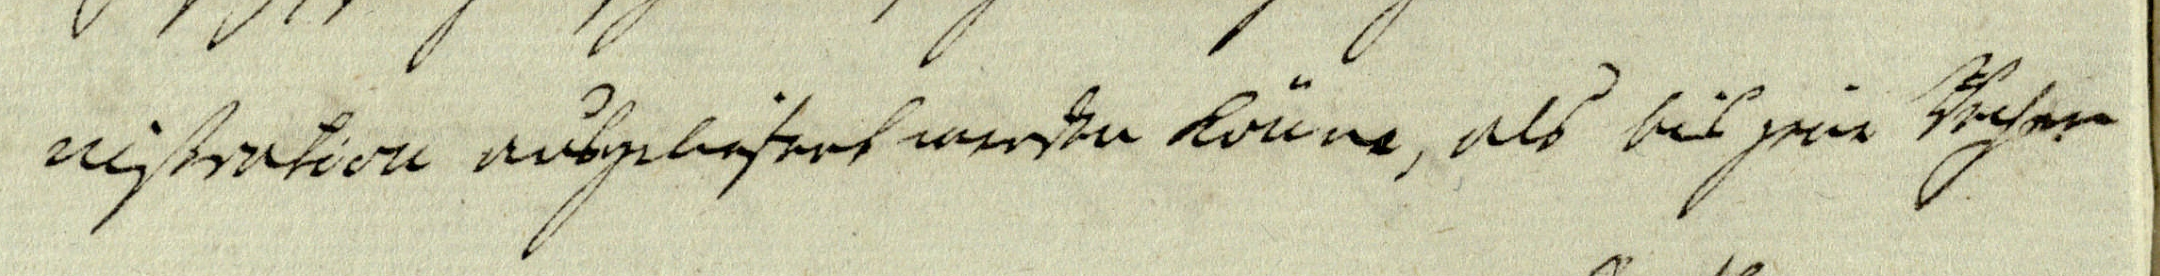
nistration ausgeliefert werden könne, als bis seine Rechen¬
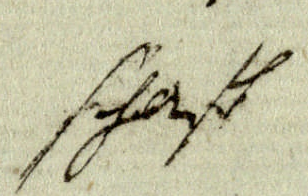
schaft
